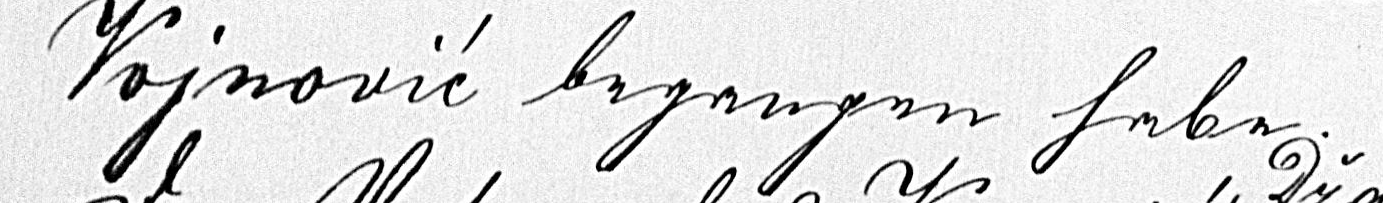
Vojnović begangen habe.
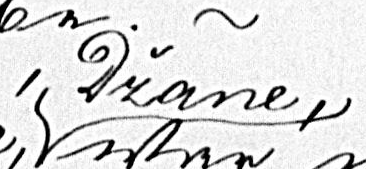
Dzane,
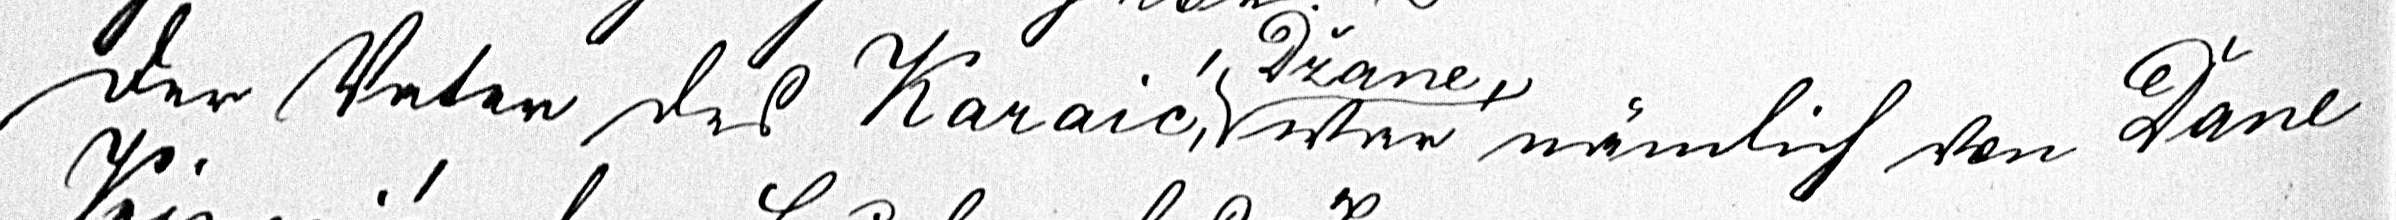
Der Vater des Karaić, wer nämlich von Dane
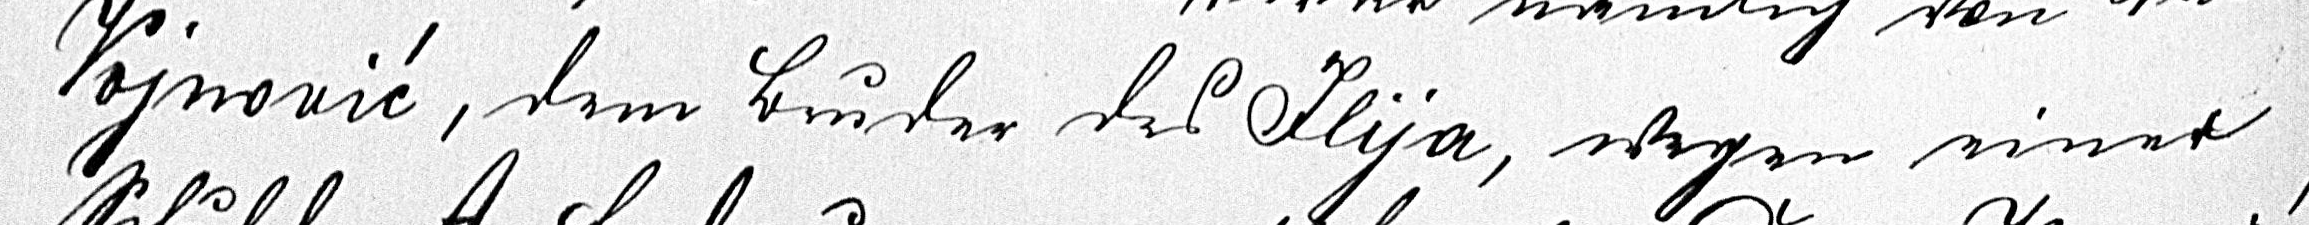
Vojnović, dem Bruder des Ilija, wegen einer
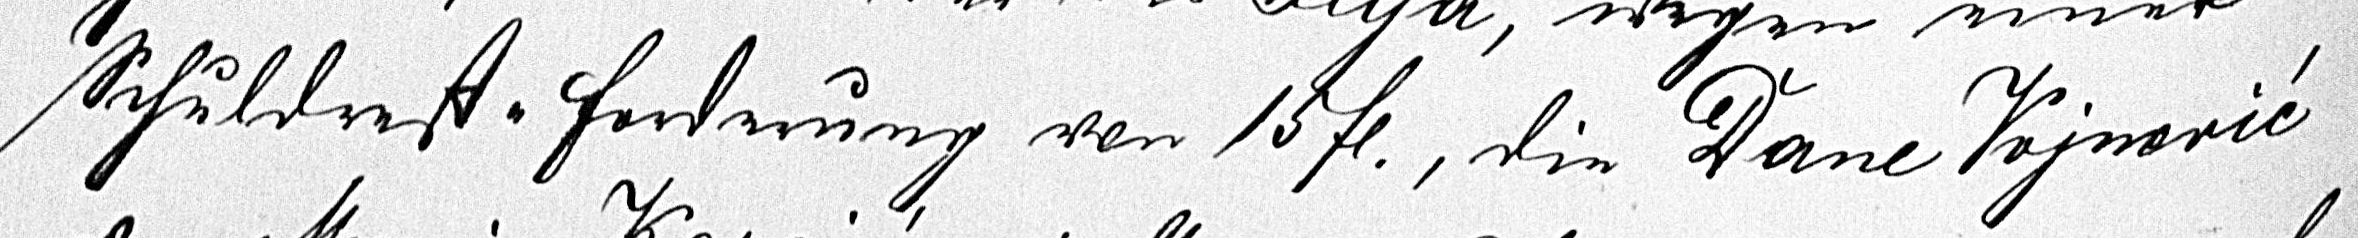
Schuldrest Forderung von 15 fl., die Dane Vojnorić
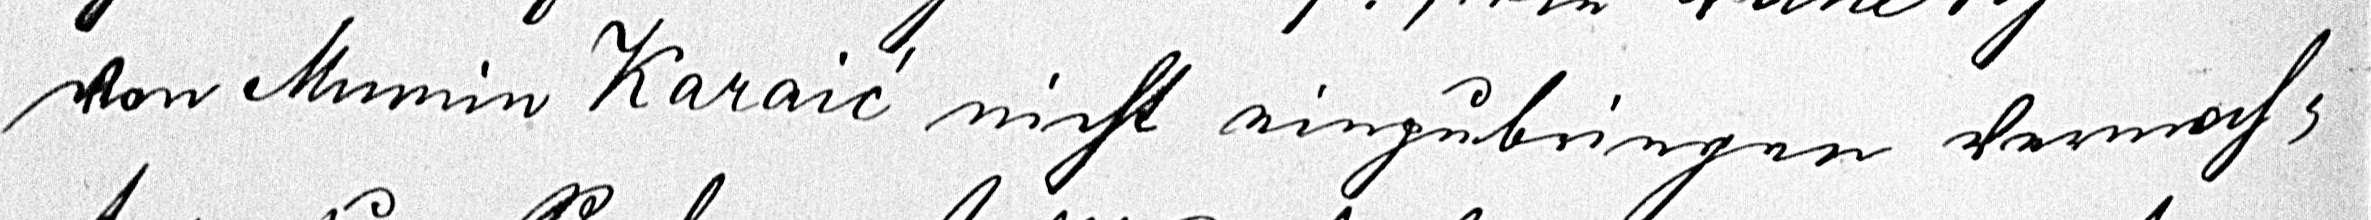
von Mumin Karaić nicht einzubringen vermach¬
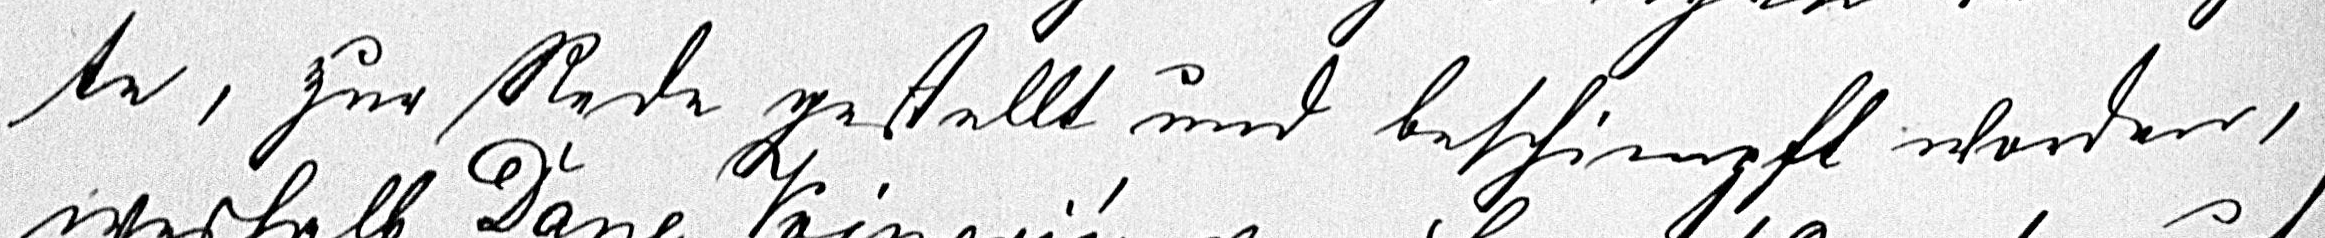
te, zur Rede gestellt und beschimpft worden,
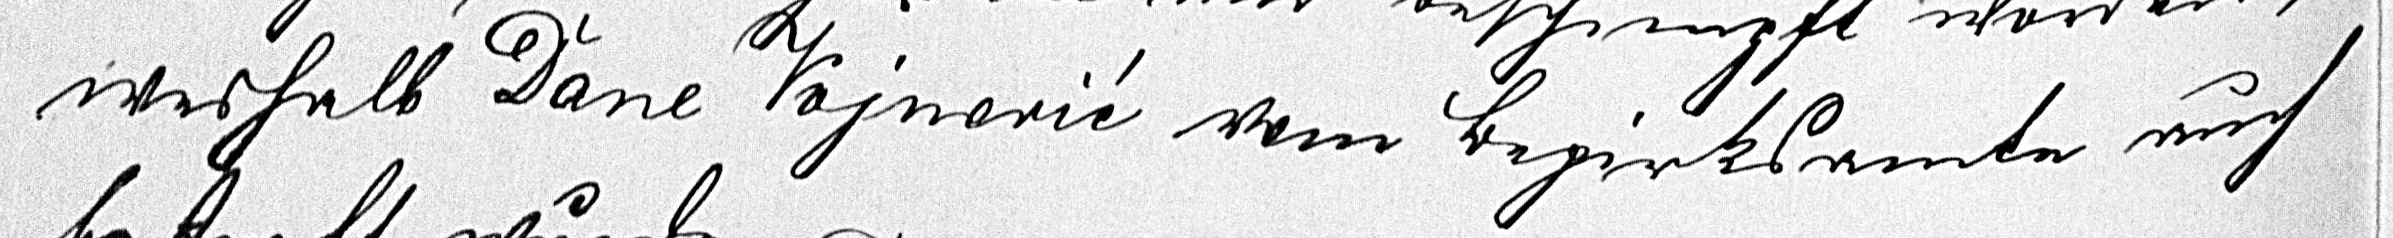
weshalb Dane Vojnerić vom Bezirksamte auch
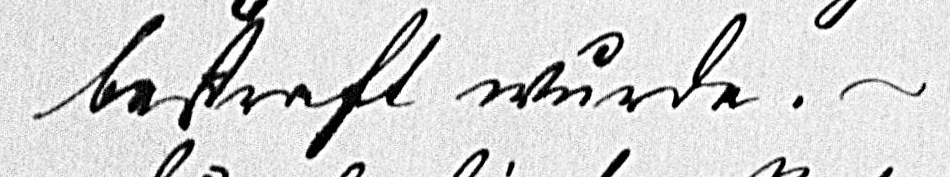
bestraft wurde.
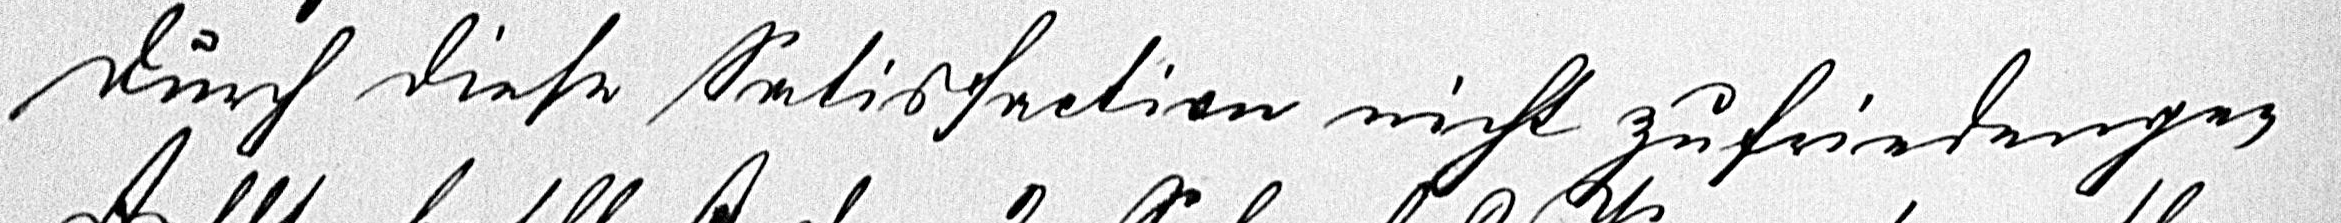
Durch diese Satisfaction nicht zufrieden ge¬
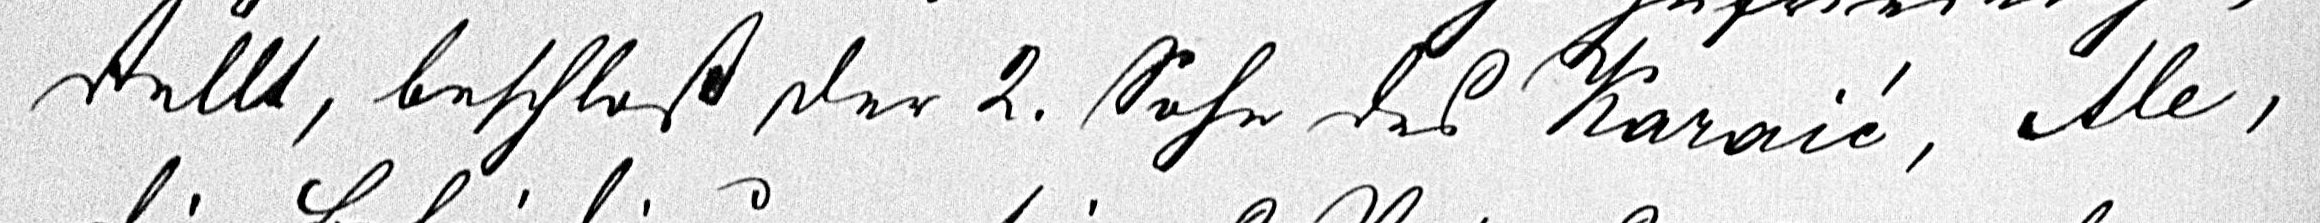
stellt, beschloß der 2. Sohn des Karaić, Ale,
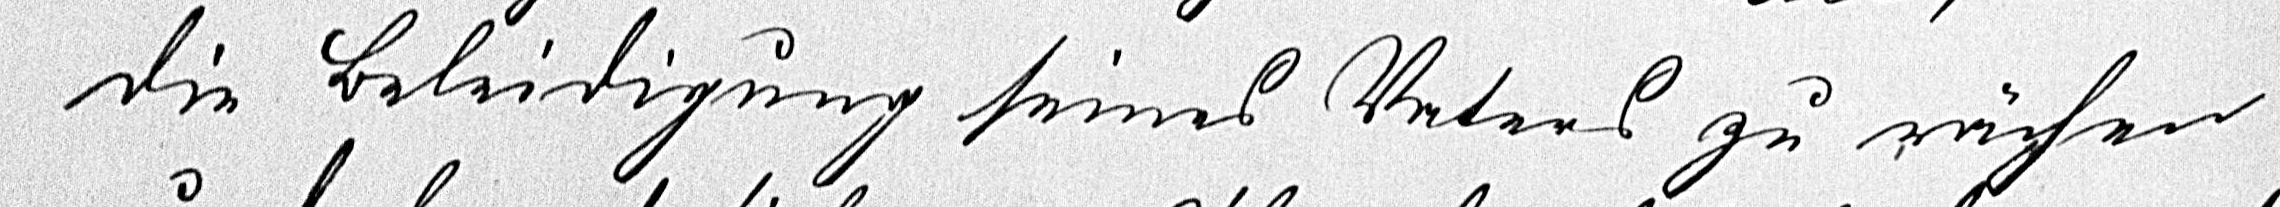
die Beleidigung seines Vaters zu rächen
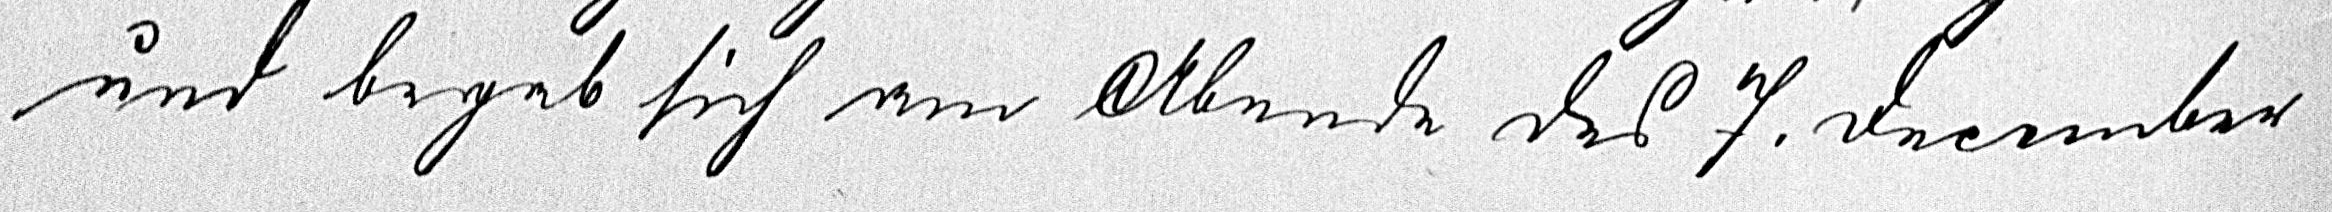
und begab sich am Abende des 7. December
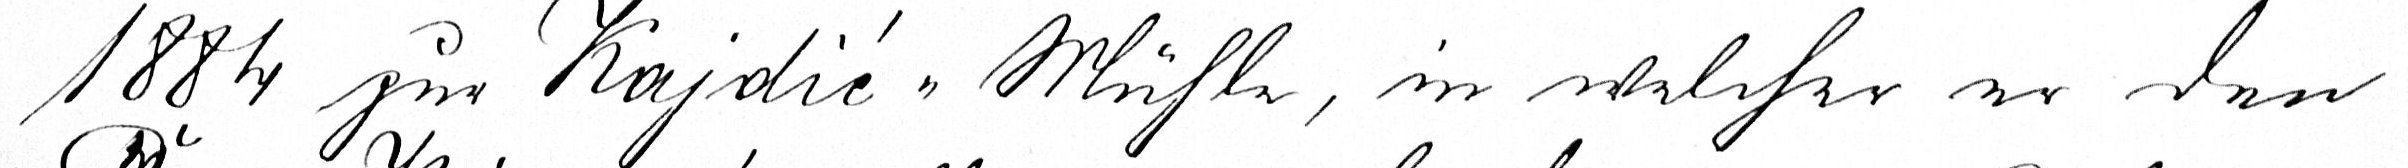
1884 zur Kajdić Mühle, in welcher er den
